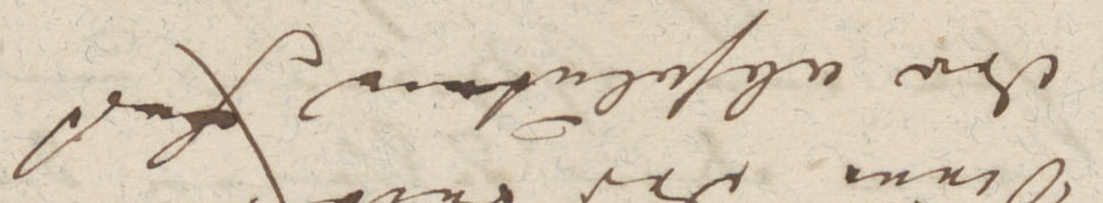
gaben den materiellen Anlass
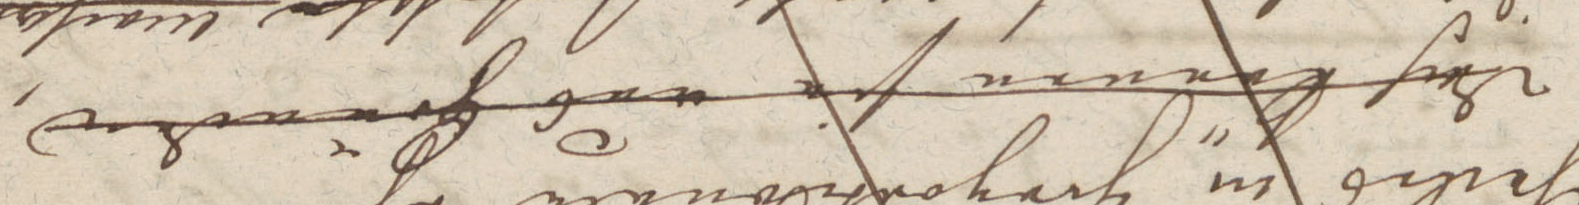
sie aus struktiven und zugleich
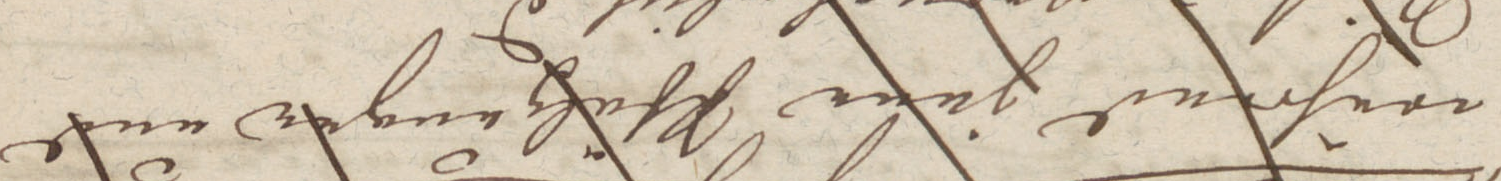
Sinne ihrer relativen durch ihre
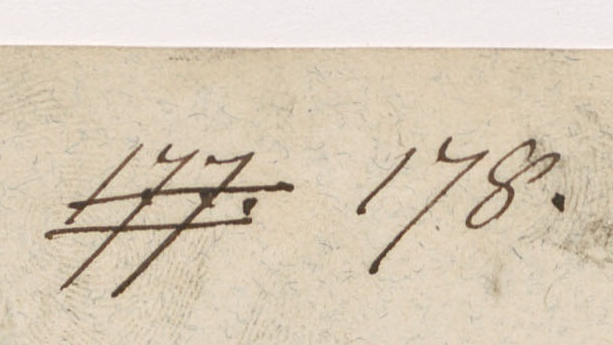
177. 178.
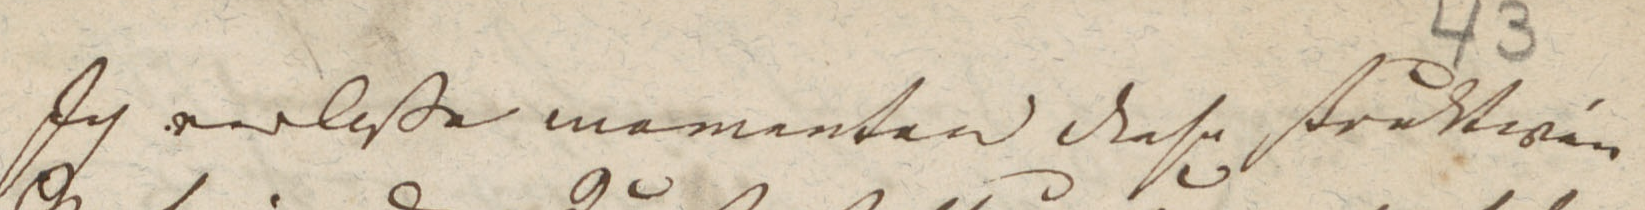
Ich verlasse momentan diese struktiven
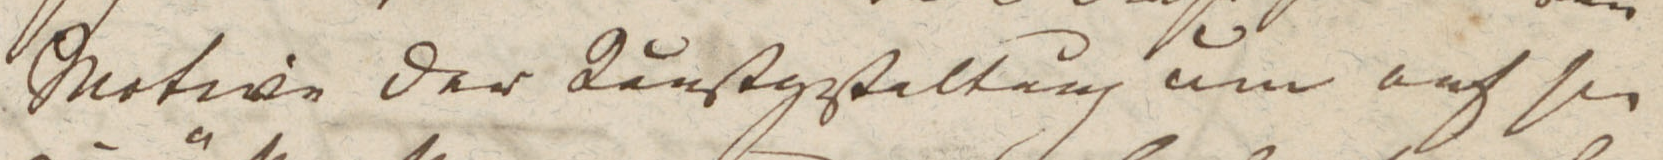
Motive der Kunstgestaltung um auf sie
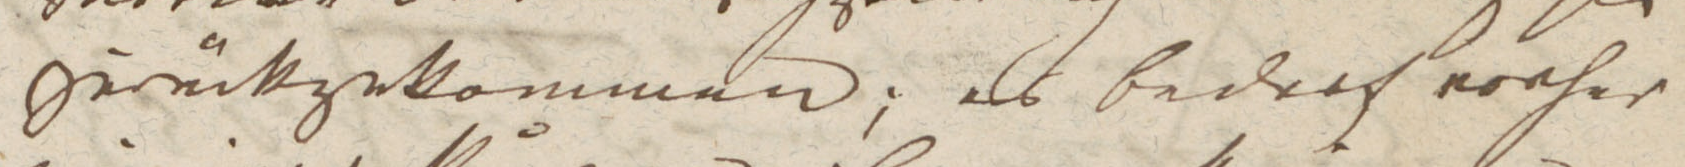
zurückzukommen; es bedarf vorher
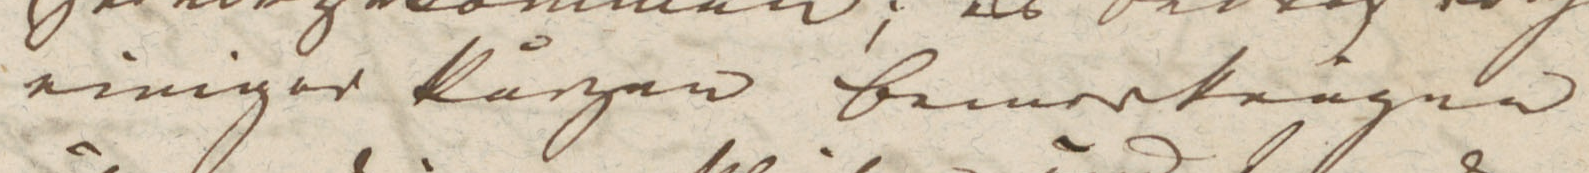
einiger kurzen Bemerkungen
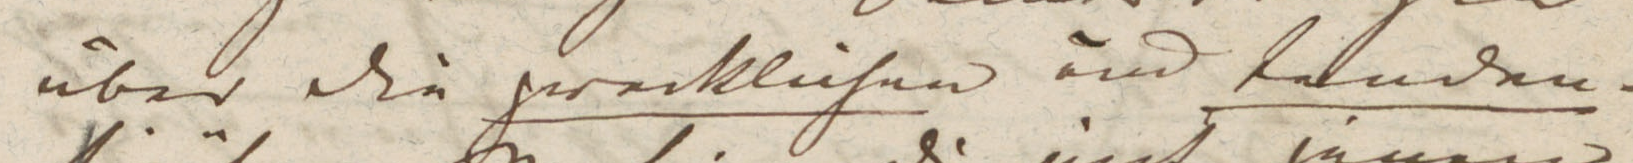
über die zwecklichen und tenden-
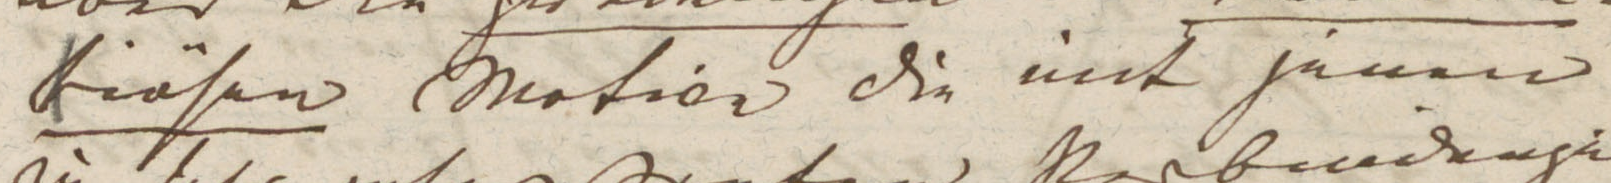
tziösen Motive die mit jenen
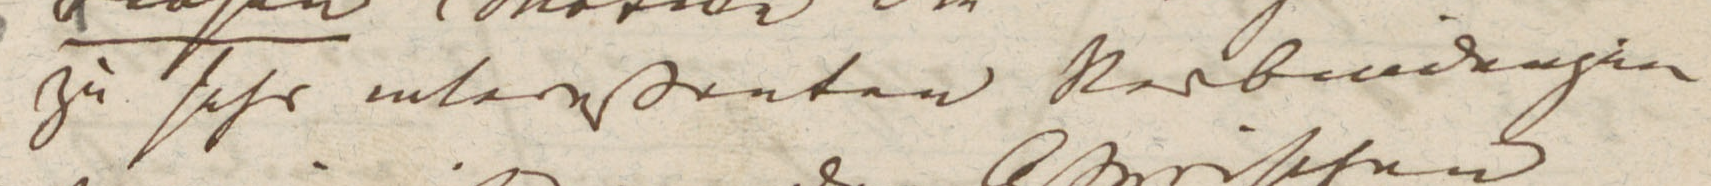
zu sehr interessanten Verbindungen
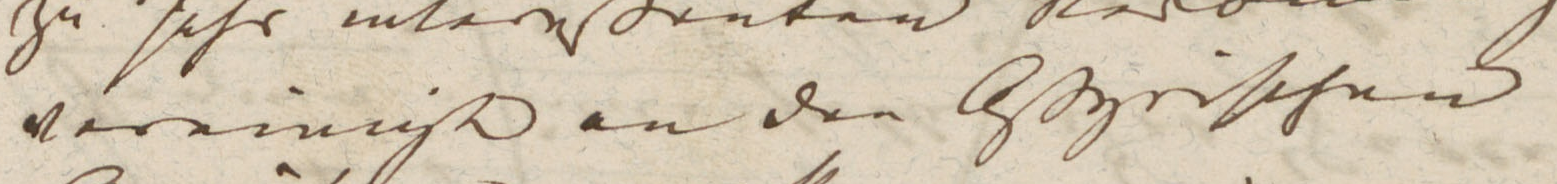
vereinigt an den Assyrischen
